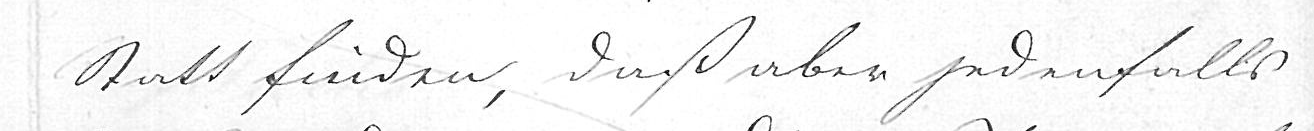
statt finden, daß aber jedenfalls
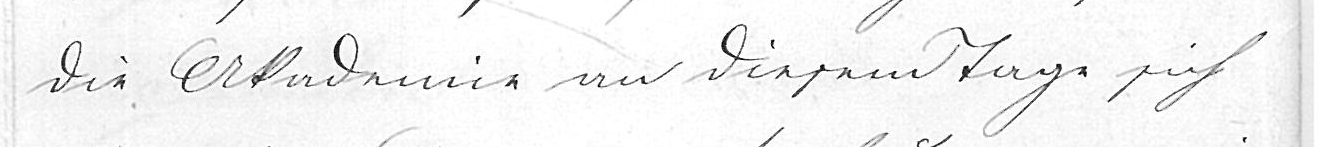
die Akademie an diesem Tage sich
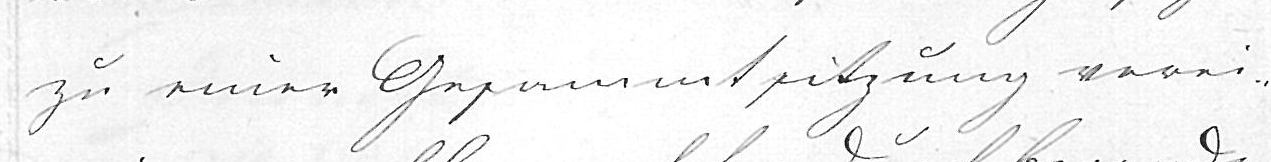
zu einer Gesammtsitzung verei-
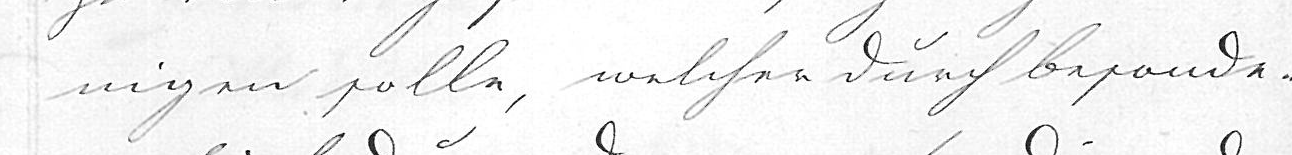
nigen solle, welcher durch besonde-
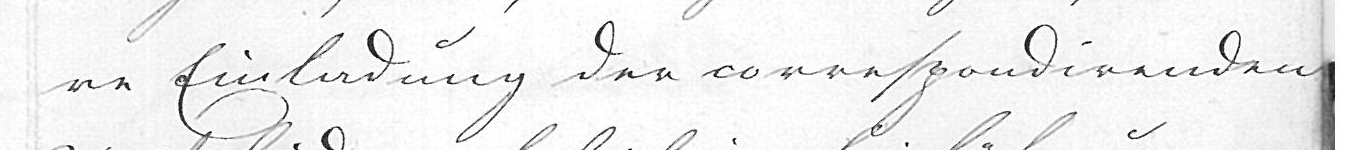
re Einladung der correspondirenden
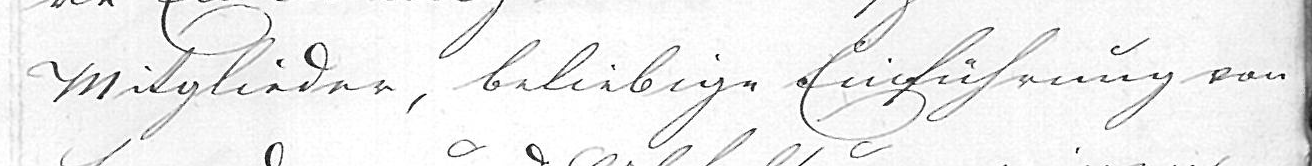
Mitglieder beliebige Einführung von
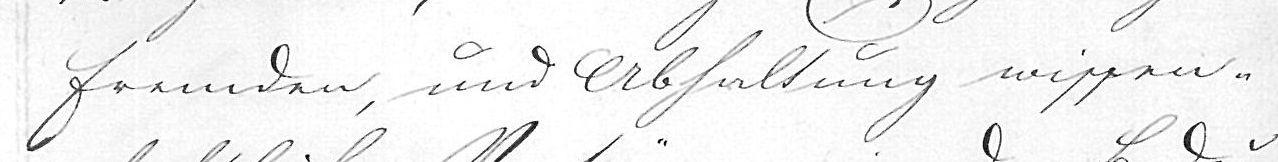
Fremden, und Abhaltung wissen-
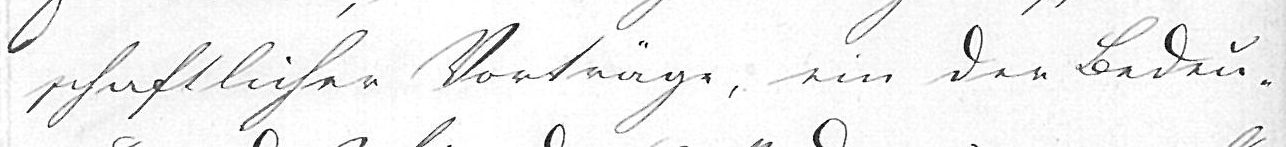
schaftlicher Vorträge, ein der Bedeu-
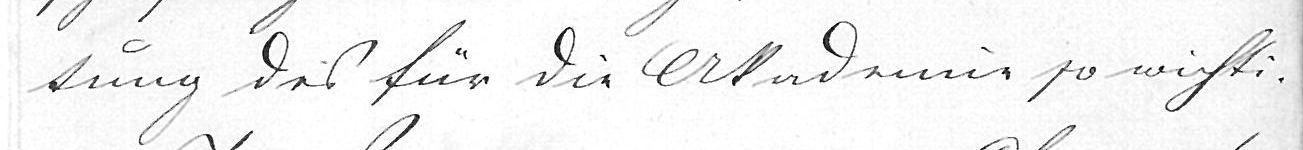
tung des für die Akademie so wichti-
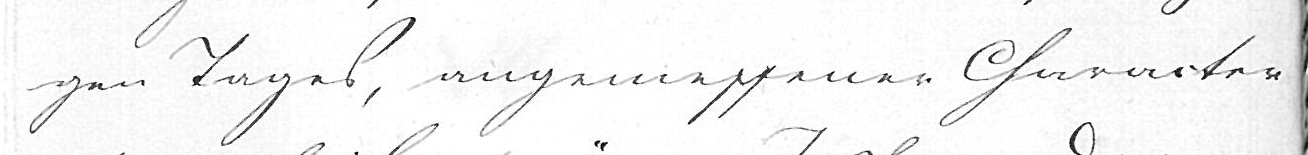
gen Tages, angemessenen Character
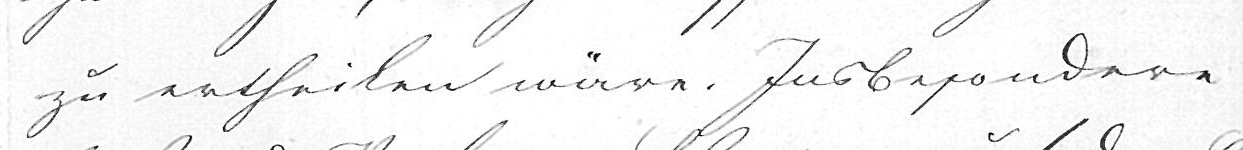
zu ertheilen wäre. Insbesondere
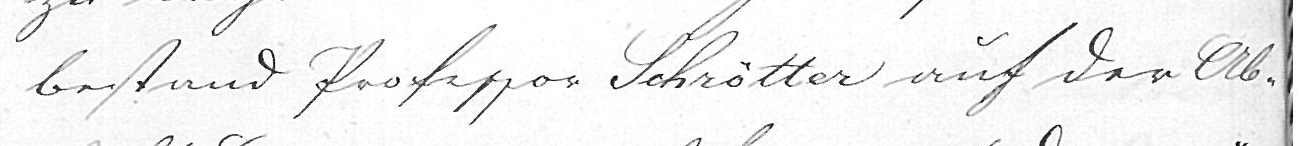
bestand Professor Schrötter auf der Ab-
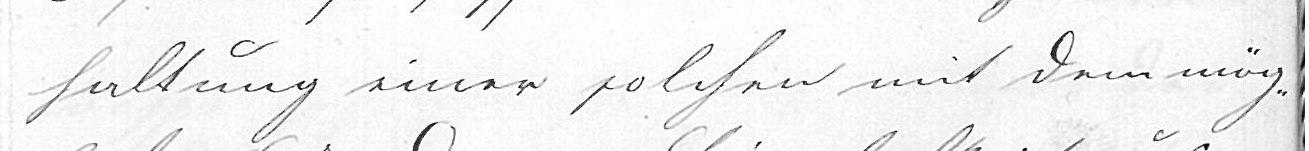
haltung einer solchen mit dem mög-
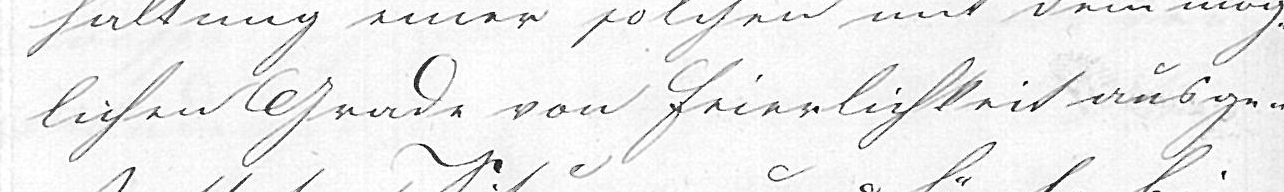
lichen Grade von Feierlichkeit ausge-
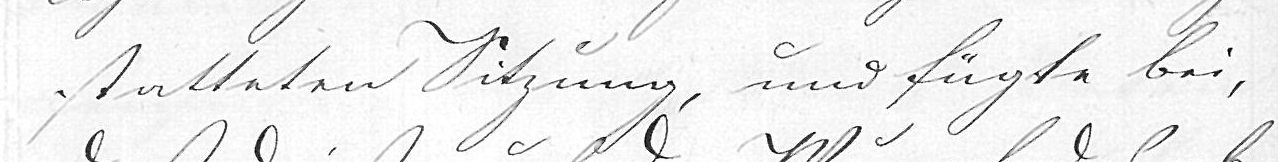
statteten Sitzung, und fügte bei,
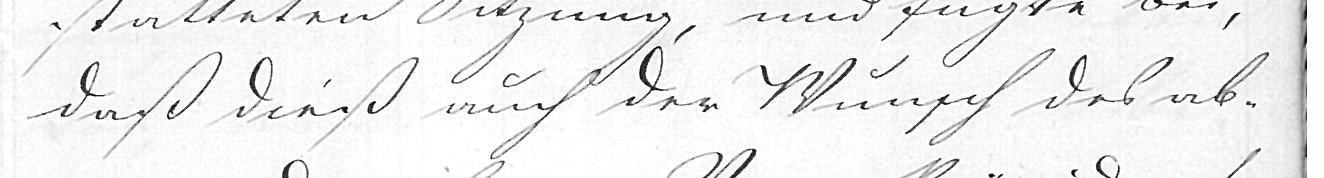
daß dieß auch der Wunsch des ab-
